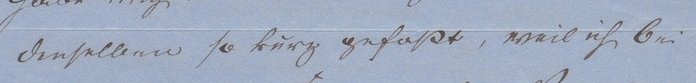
denselben so kurz gefaßt, weil ich bei
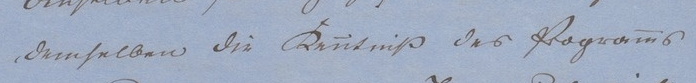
demselben die Kenntniß des Programms
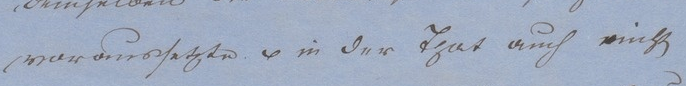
voraussetzte & in der That auch nicht
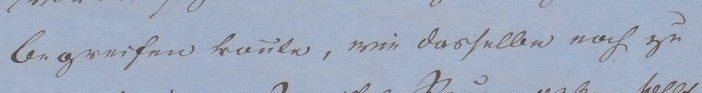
begreifen konnte, wie dasselbe noch zu
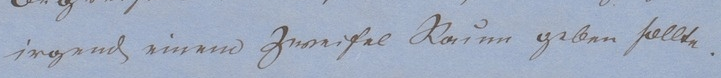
irgend einem Zweifel Raum geben sollte.
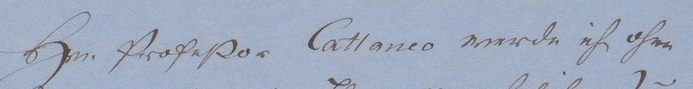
Hrn. Profeßor Cattaneo werde ich ohne
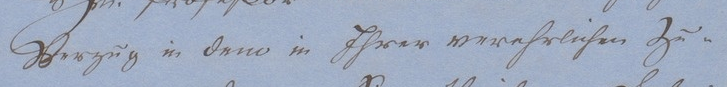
Verzug in dem in Ihrer verehrlichen Zu-
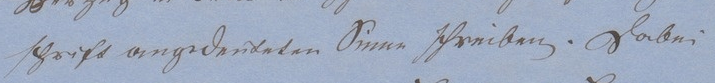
schrift angedeuteten Sinne schreiben. Dabei
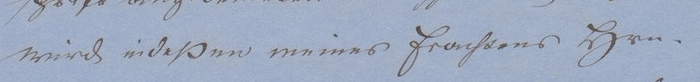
wird indeßen meines Erachtens Hrn.
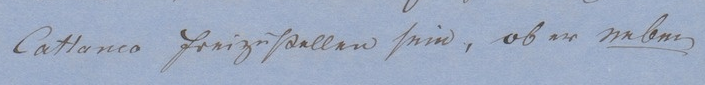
Cattaneo freizustellen sein, ob er neben
